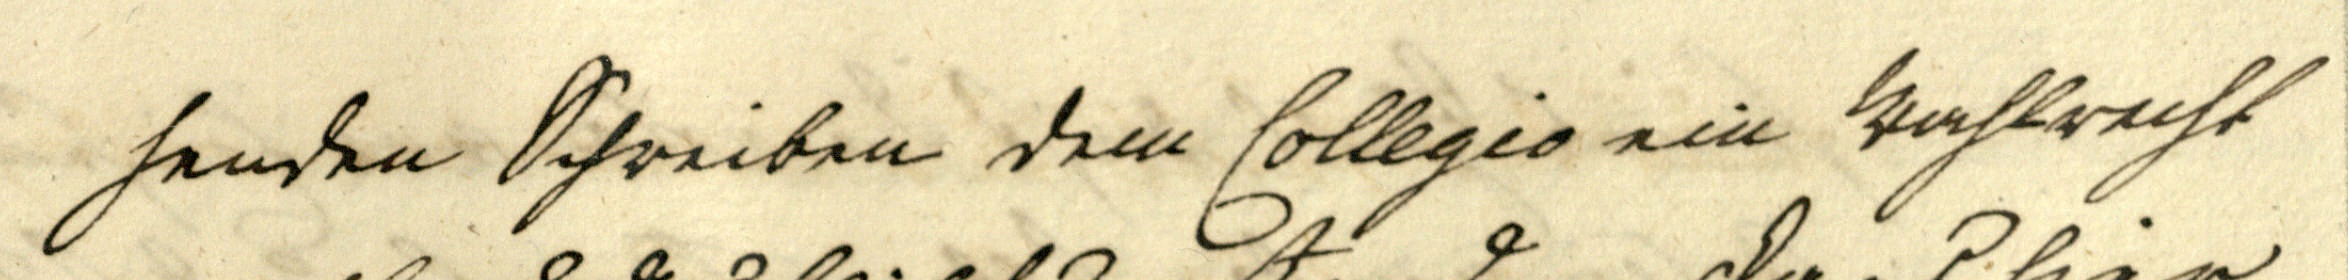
henden Schreiben dem Collegio ein Wahlrecht
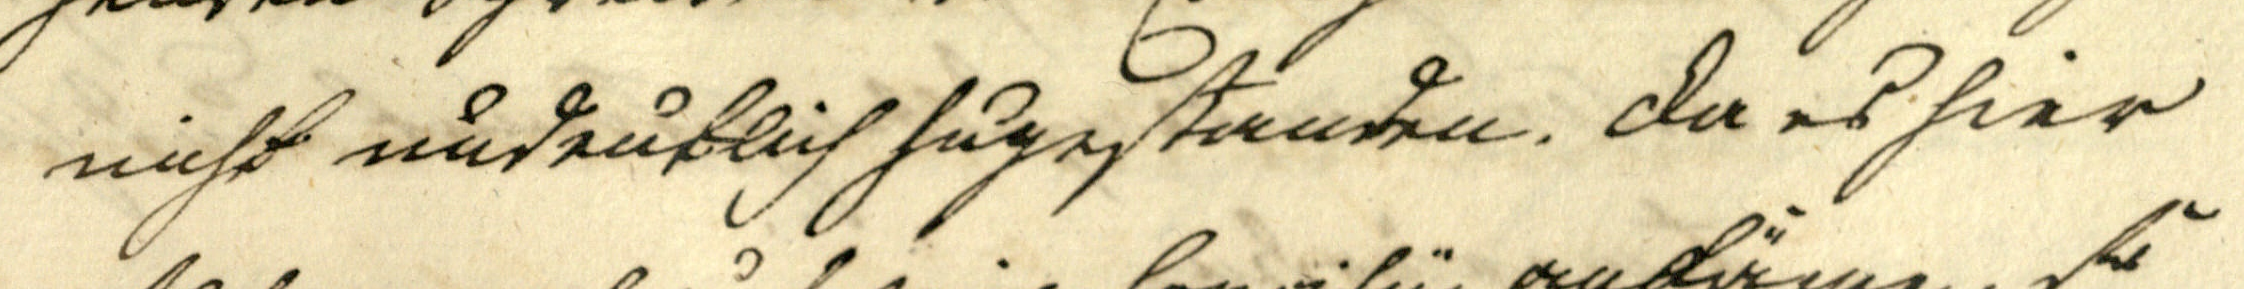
nicht undeutlih zugestanden. Da es hier
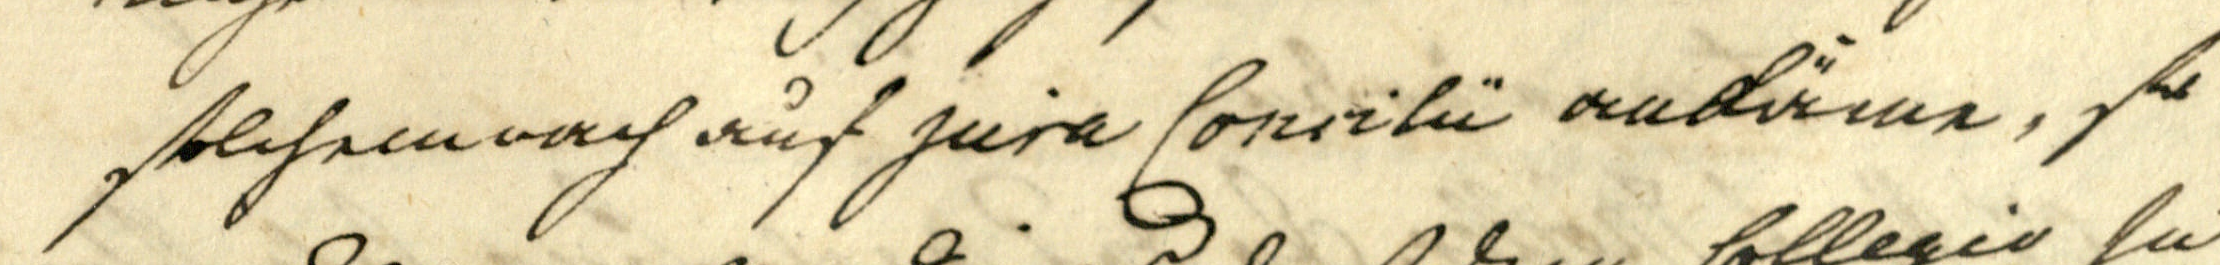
solchemnach auf jura Concilii ankäme, so
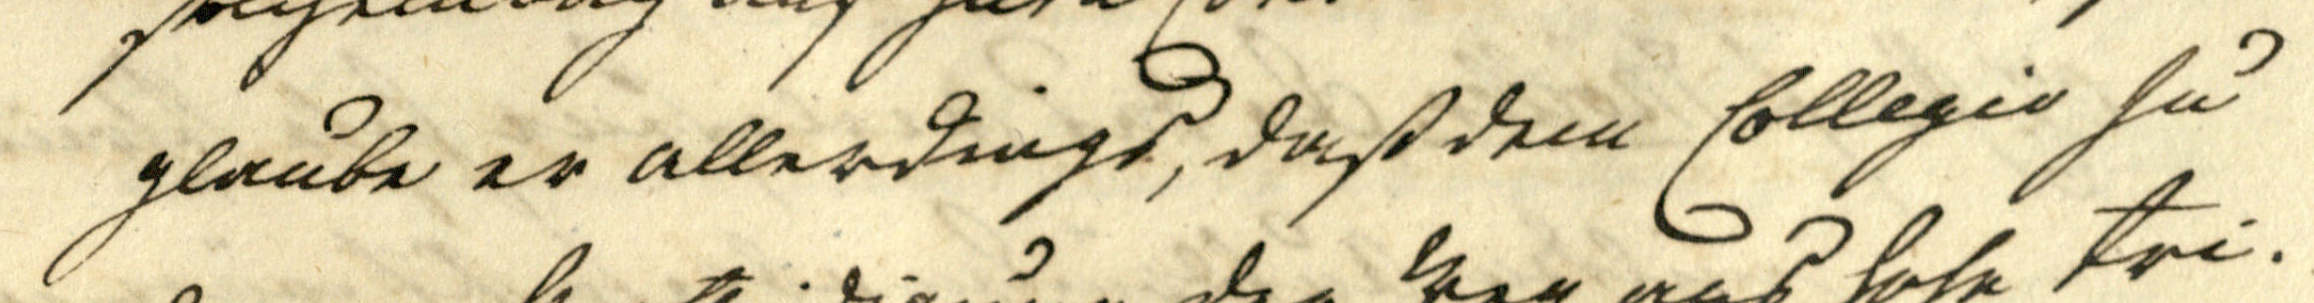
glaube er allerdings, daß dem Collegio zu
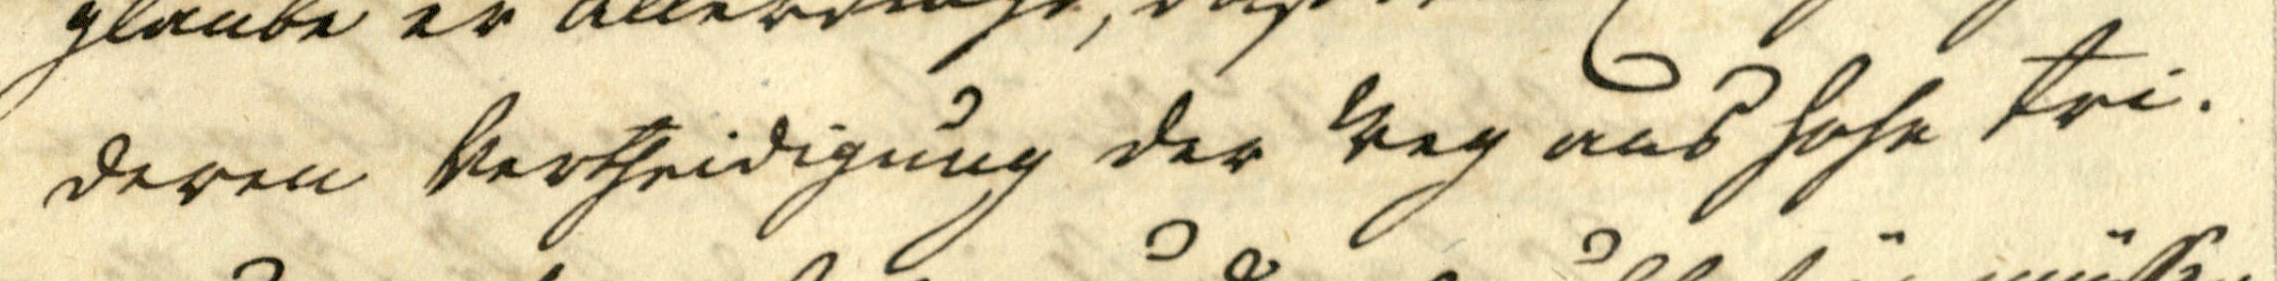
deren Vertheidigung der Weg ans hohe Tri¬
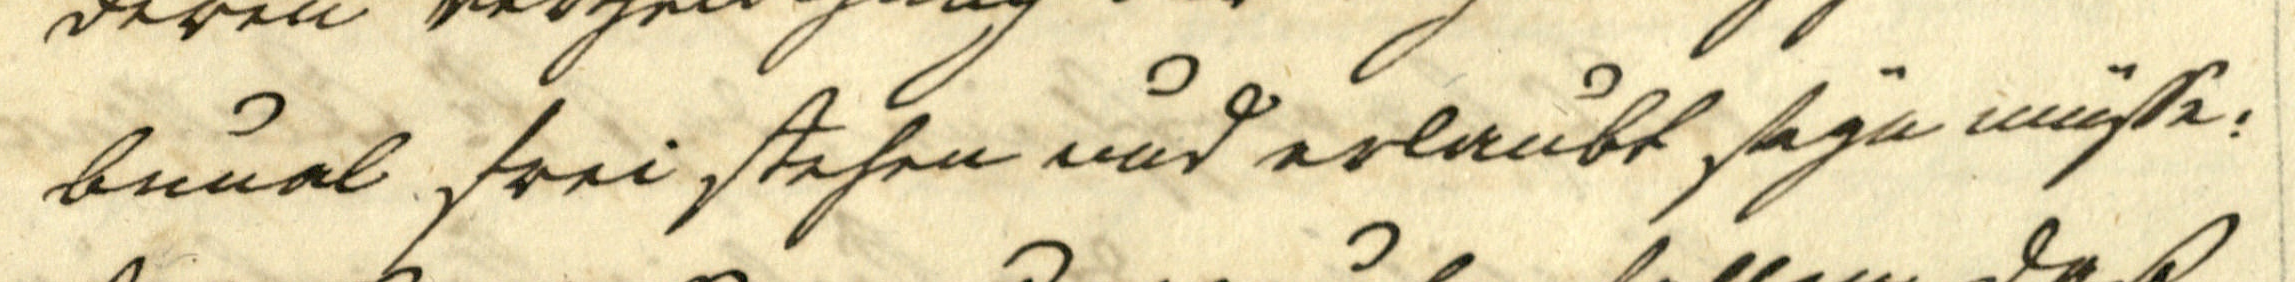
bunal frei stehen und erlaubt seÿn müsse.
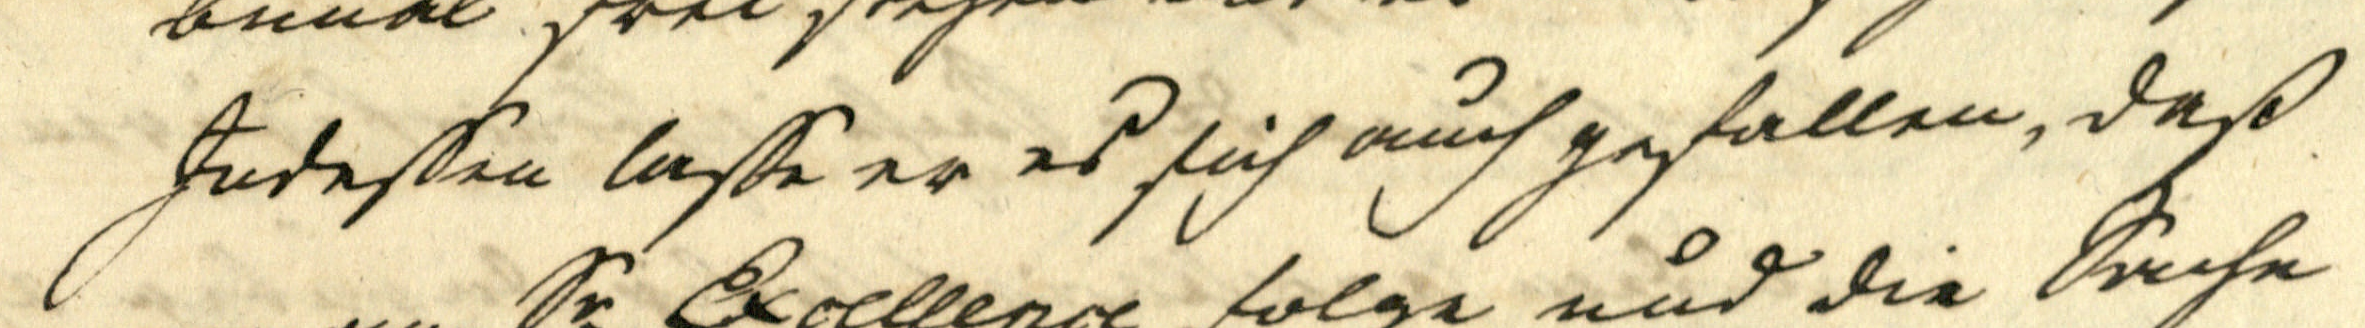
Indessen lasse er es sich auch gefallen, daß
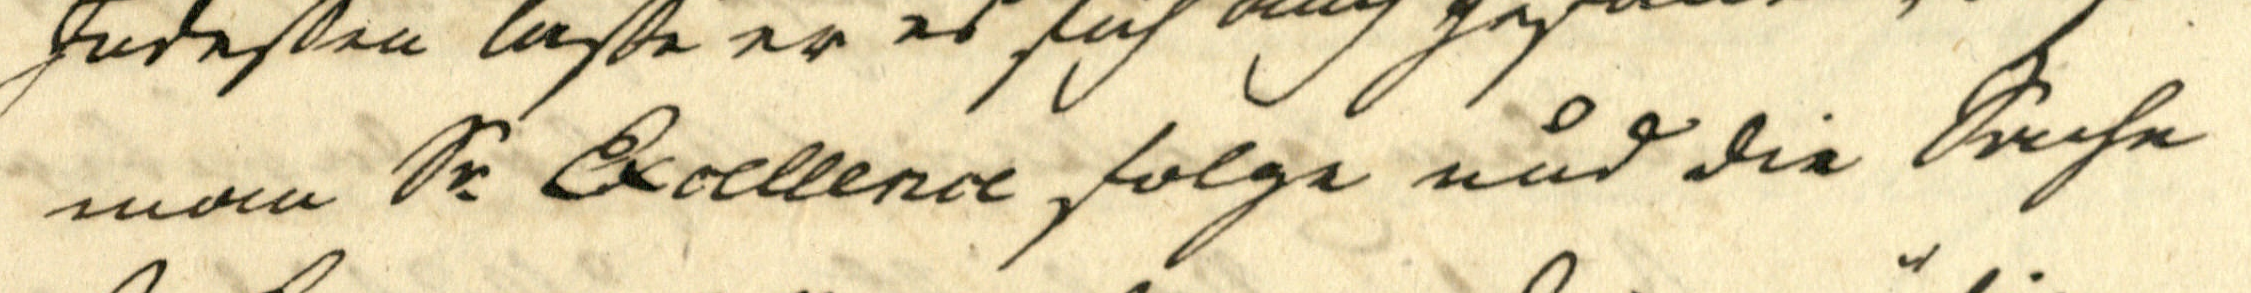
man Sr Excellence folgen und die Sache
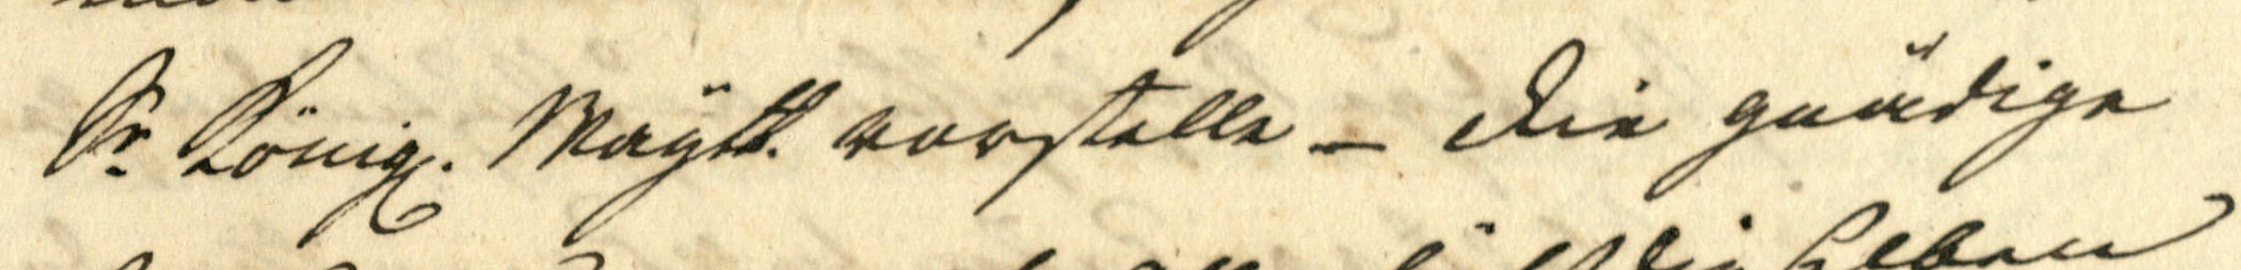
Sr Königl. Maÿtt. vorstelle. Die gnädige
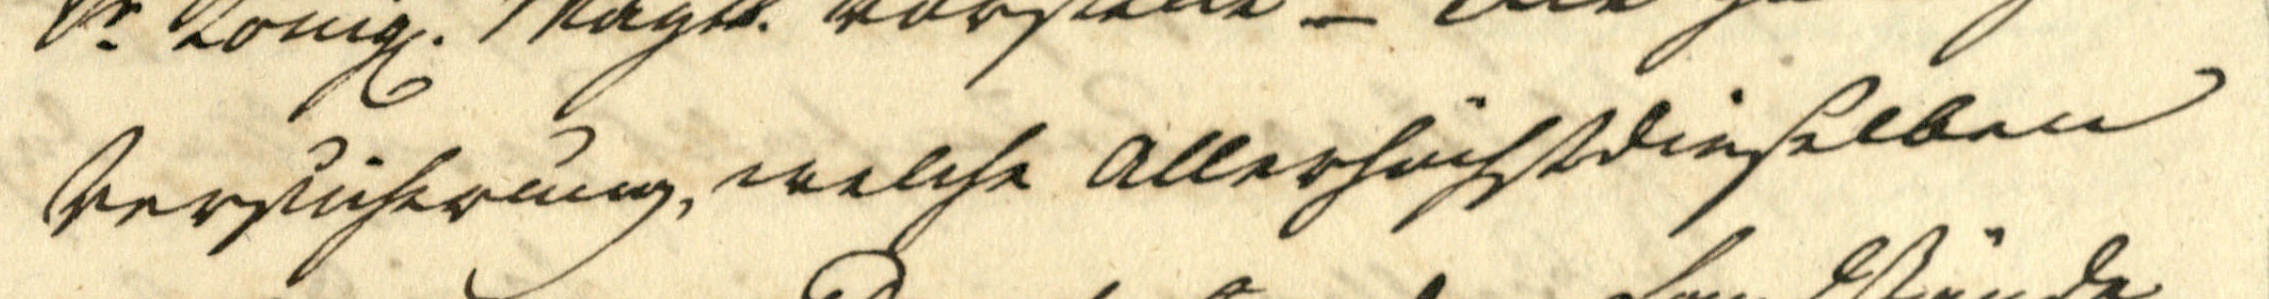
Versicherung, welche Allerhöchstdieselben
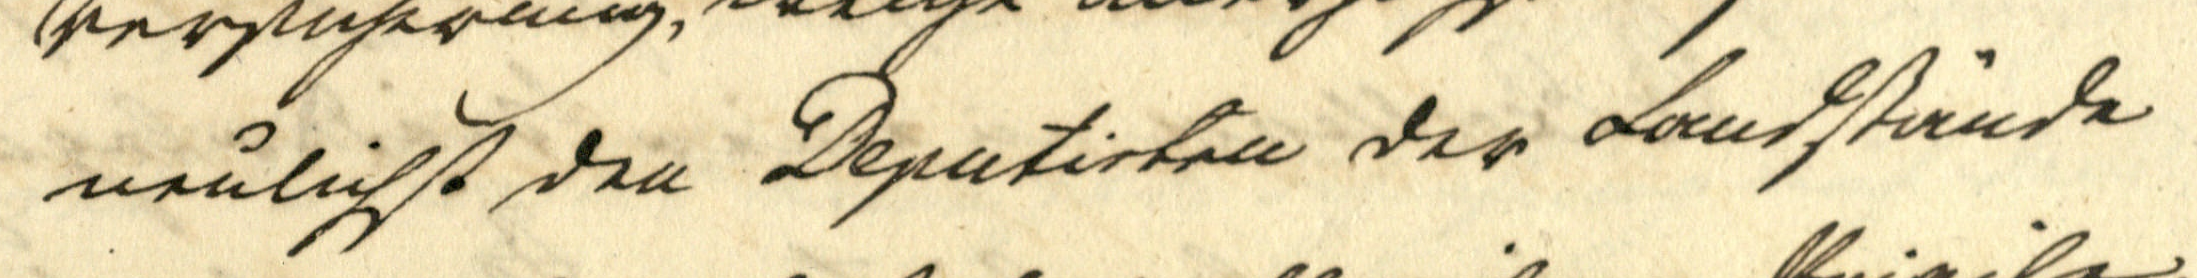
neulichst den Deputirten der Landstände
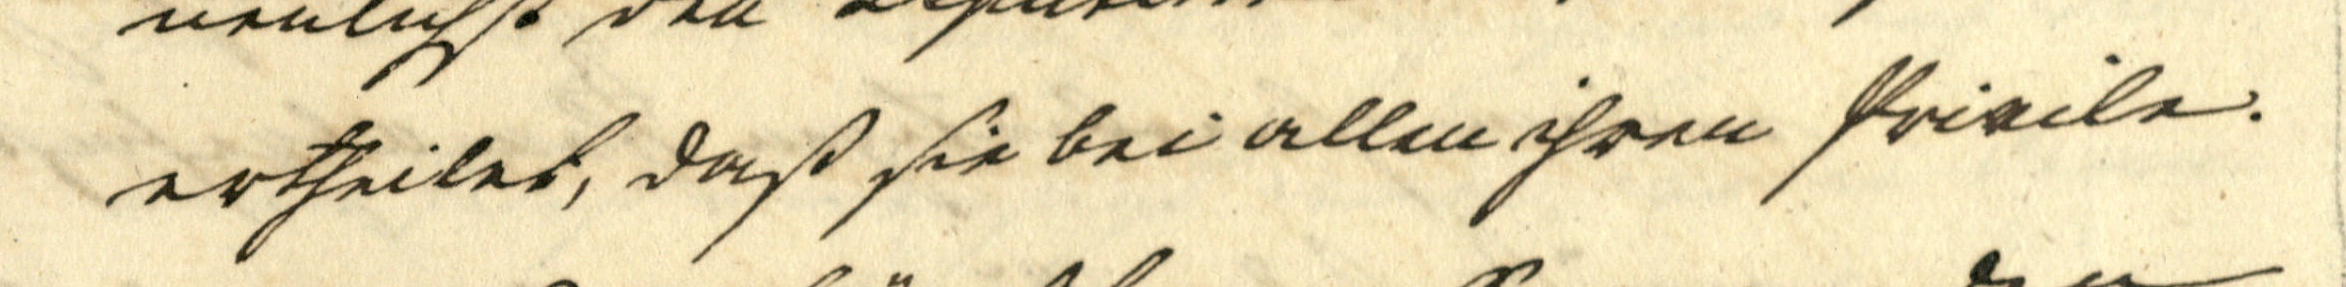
ertheilet, daß sie bei allen ihren Privile¬
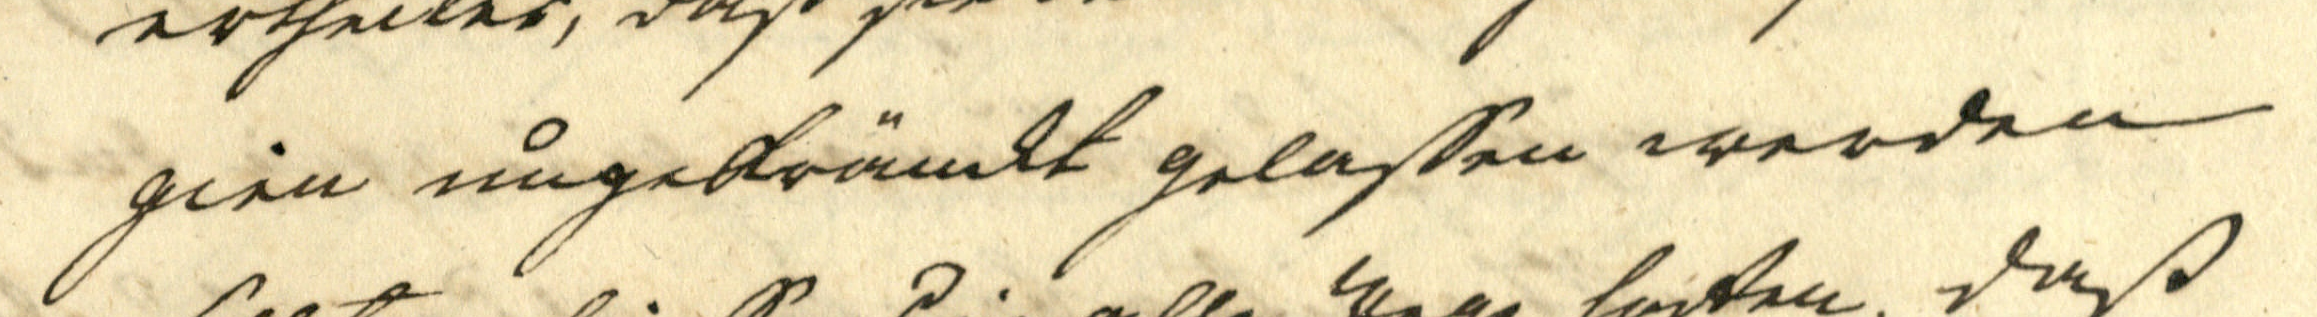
gien ungekränckt gelassen werden
